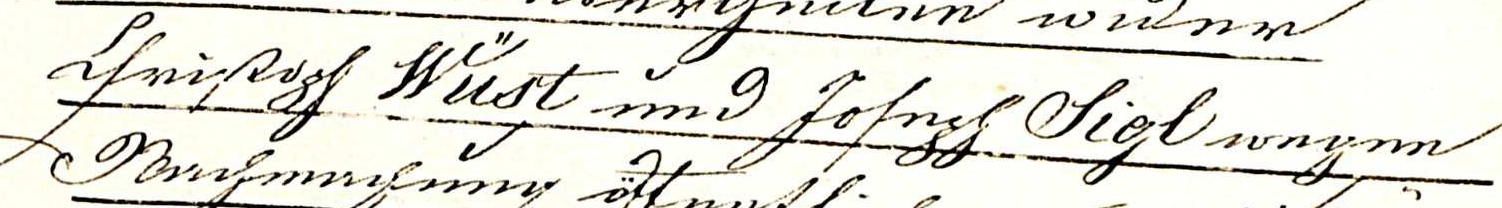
Christoph Wüst und Joseph Sigl wegen
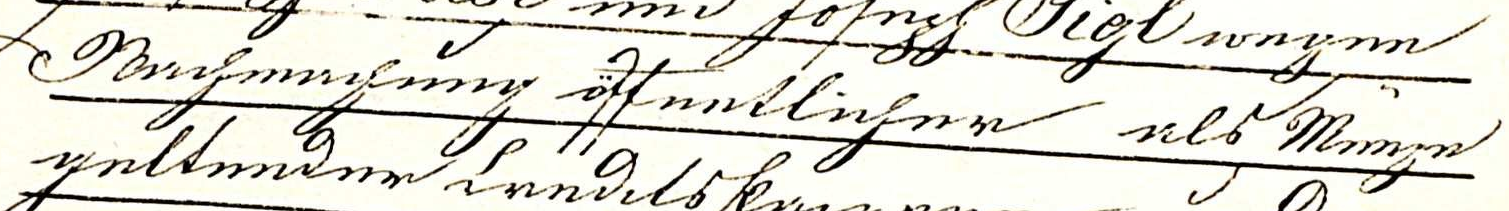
Nachmachung öffentlicher als Münze
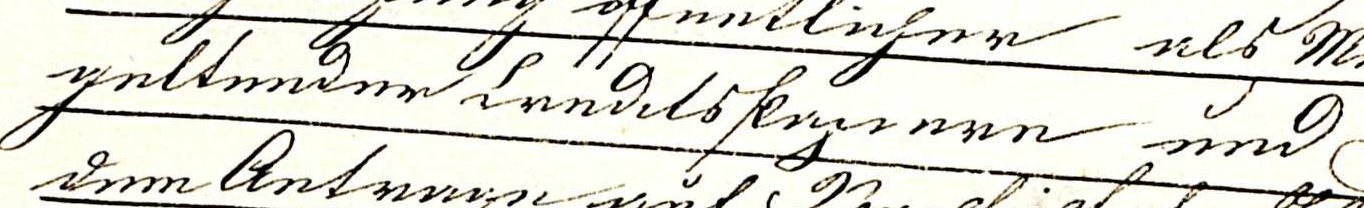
geltender Creditspapiere und
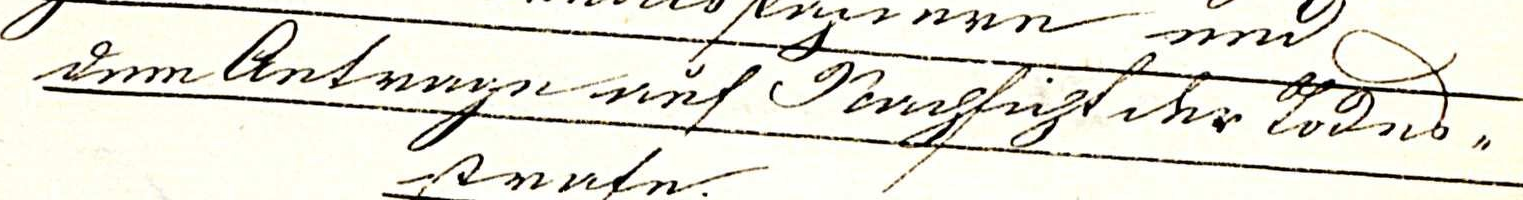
dem Antrage auf Nachsicht der Todes¬
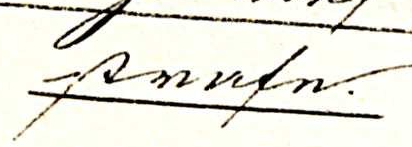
strafe.
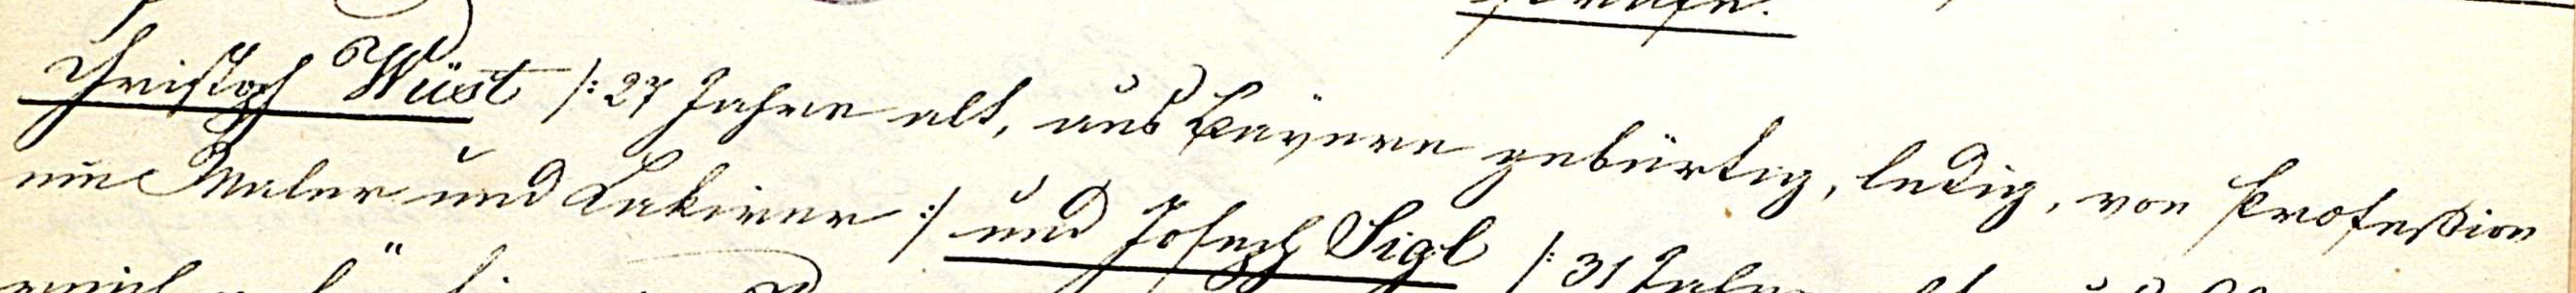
Christoph Wüst (27 Jahre alt, aus Bayern gebürtig, ledig, von Profeßion
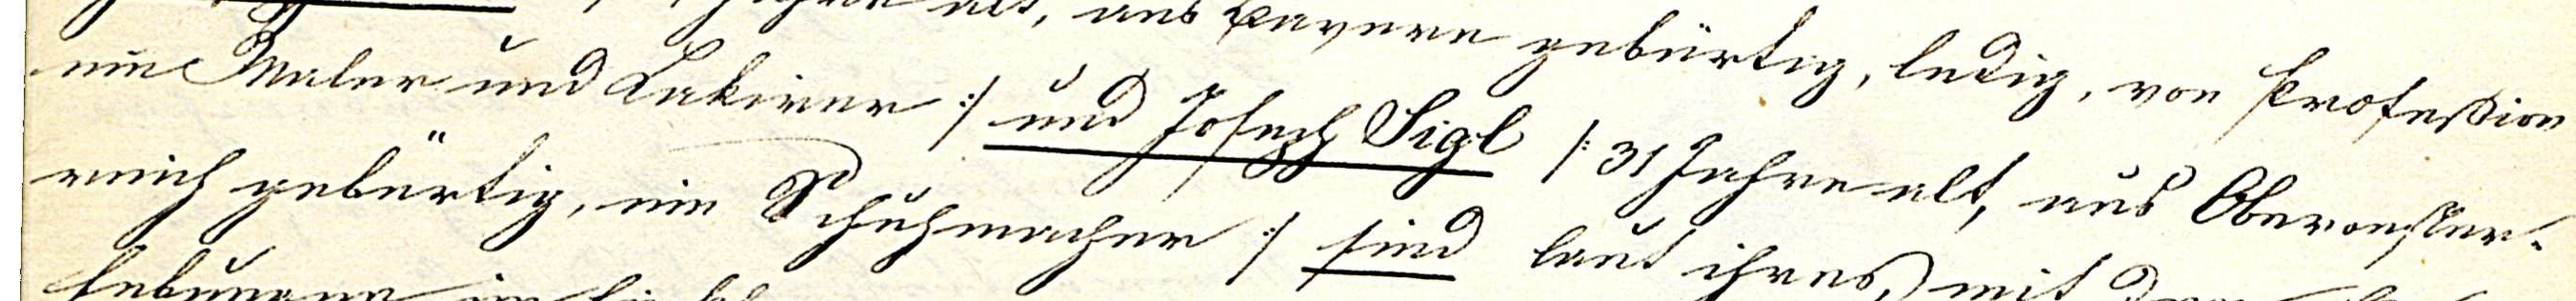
eine Maler und Lakirer) und Joseph Sigl (31 Jahre alt, aus Oberoester¬
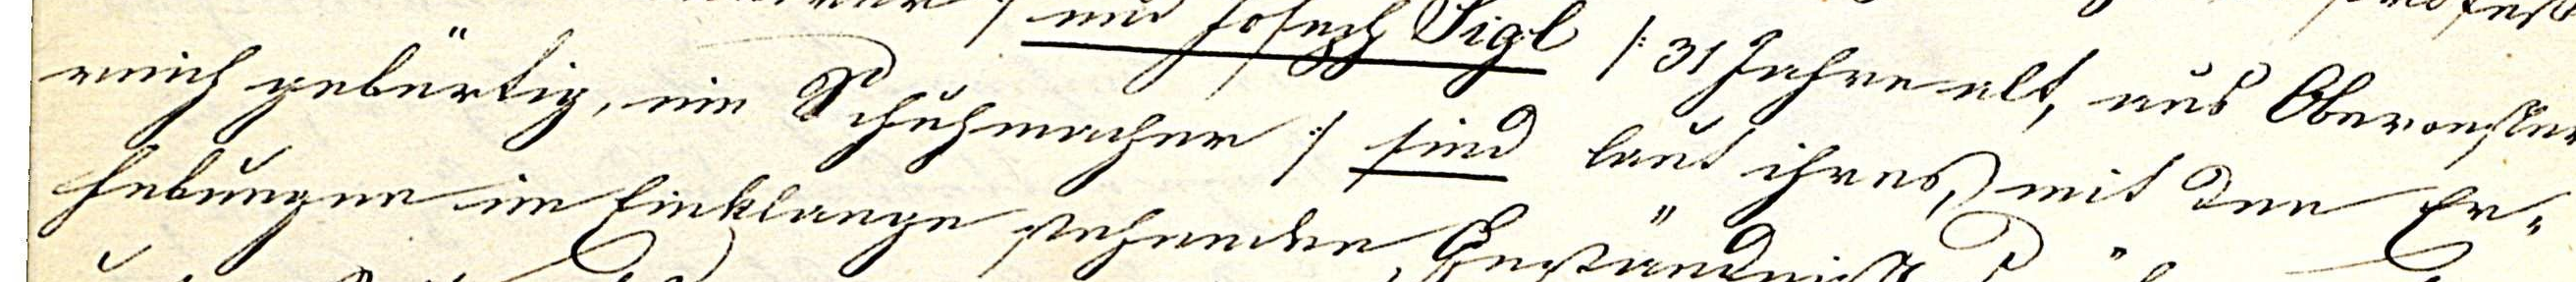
reich gebürtig, ein Schuhmacher) sind laut ihres, mit den Er¬
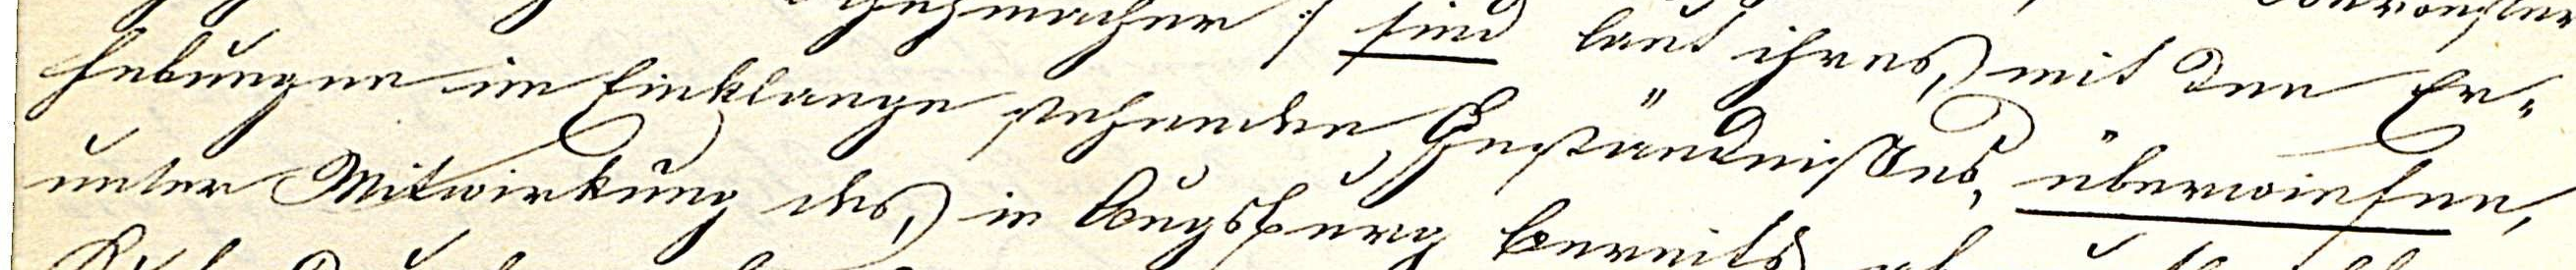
hebungen im Einklange stehenden Geständnißes, überwiesen,
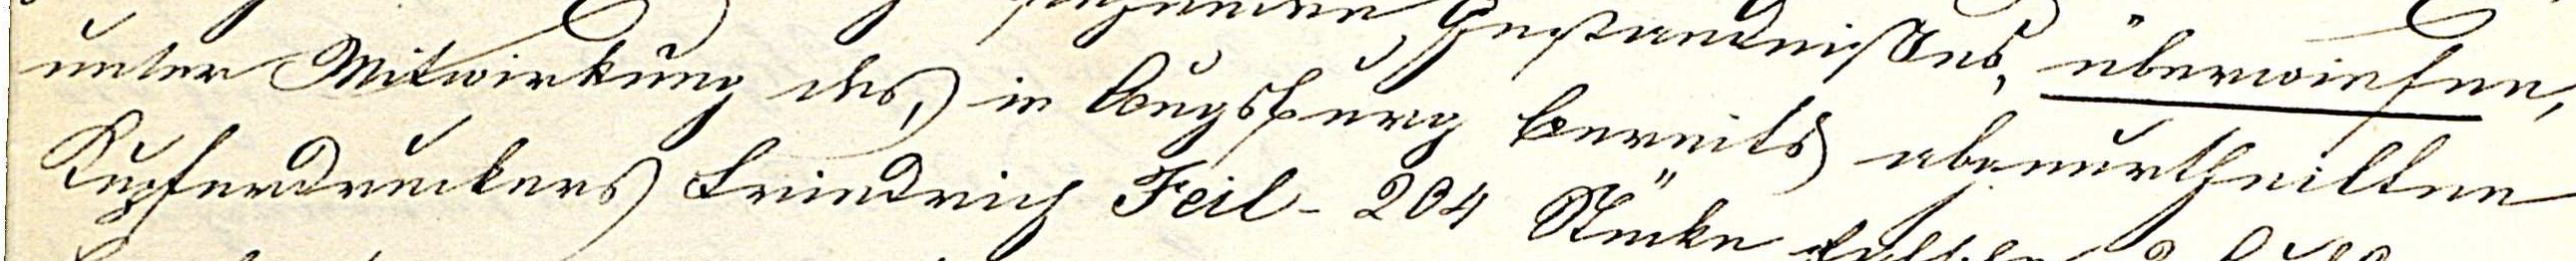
unter Mitwirkung des, in Augsburg bereits abzuurtheilen
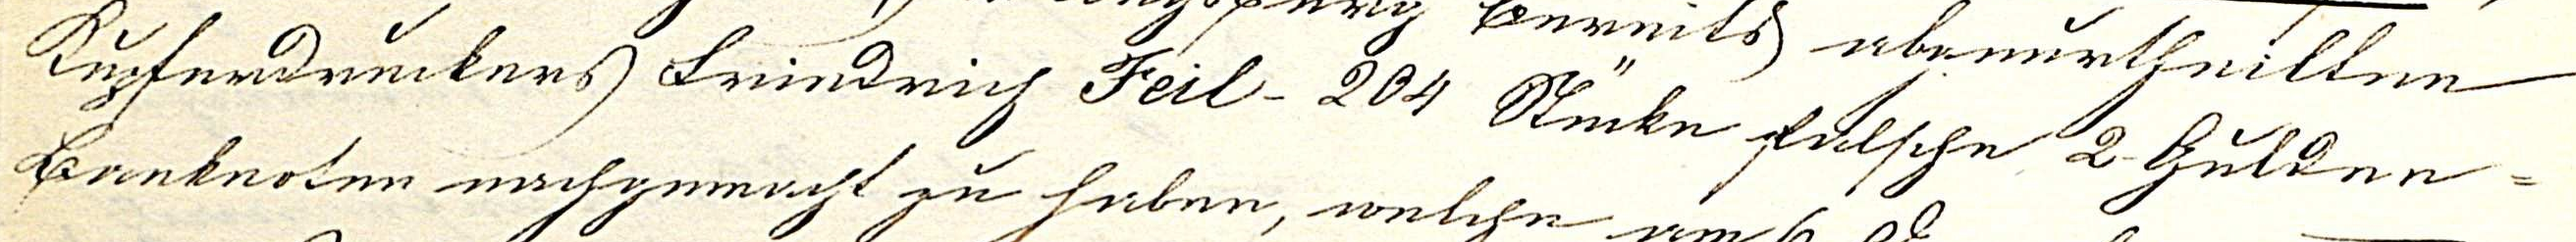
Kupferdruckers Friedrich Feil – 204 Stücke falsche 2 Gulden-
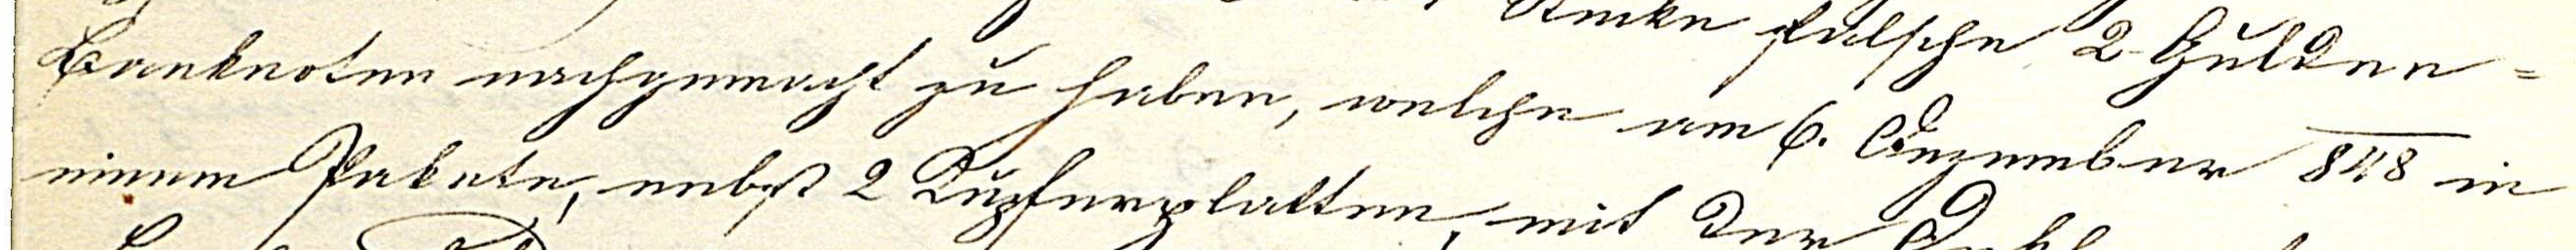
Banknoten nachgemacht zu haben, welche am 6. Dezember 848 in
